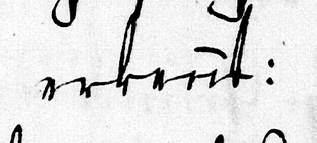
erkennt:
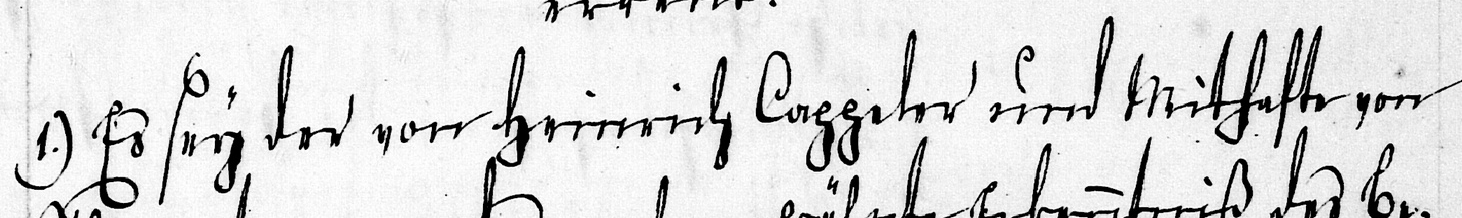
1.) Es sey der von Heinrich Cappeler [sic!] und
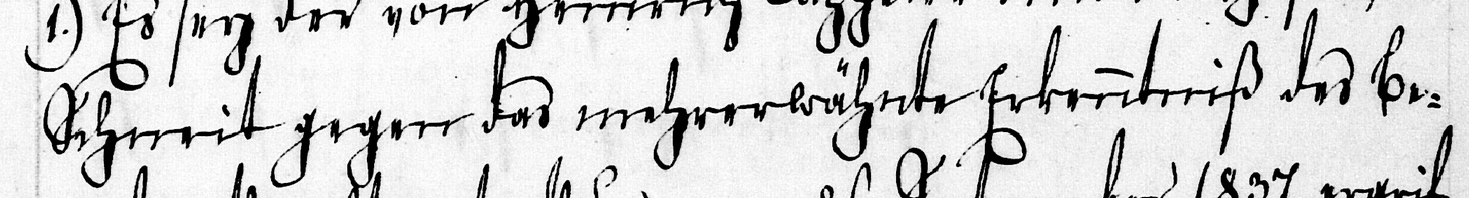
Schneit gegen das mehrerwähnte Erkenntniß des Be¬
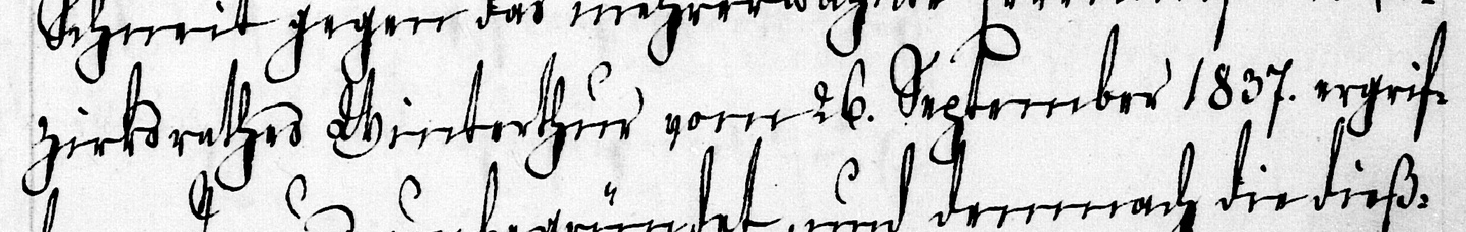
zirksrathes Winterthur vom 26. September 1837. ergrif¬
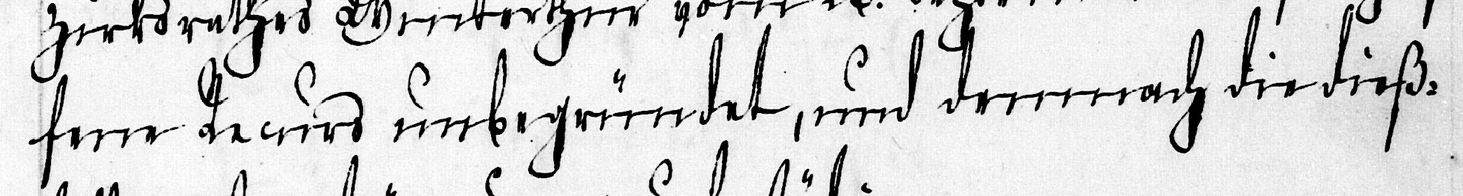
fene Recurs unbegründet, und demnach die dieß¬
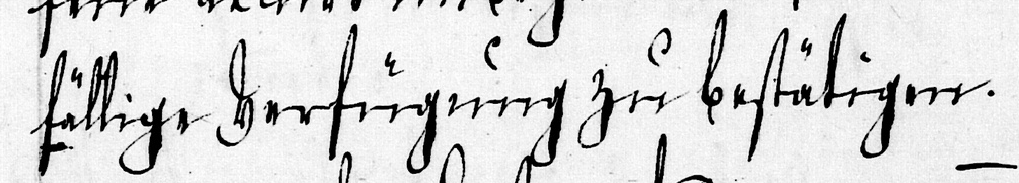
fällige Verfügung zu bestätigen.
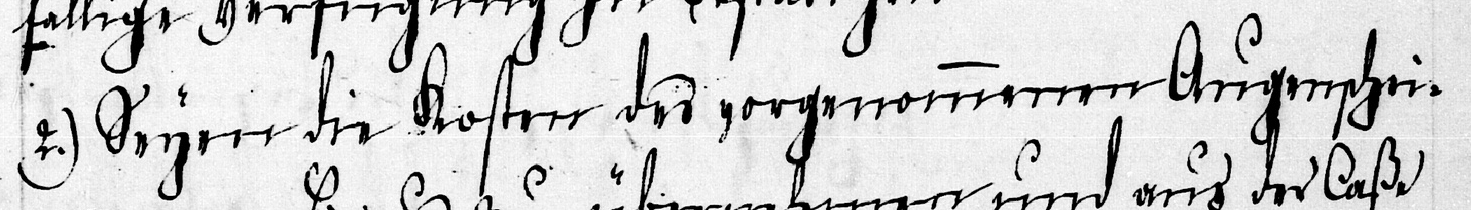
2.) Seyen die Kosten des vorgenommenen Augenschei¬
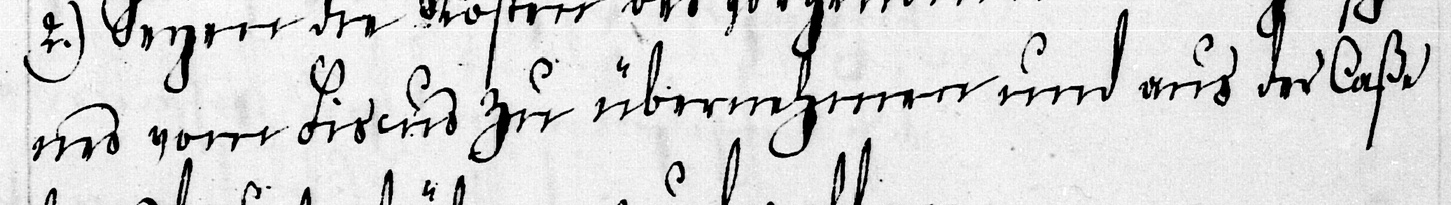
nes vom Fiscus zu übernehmen und aus der Caße
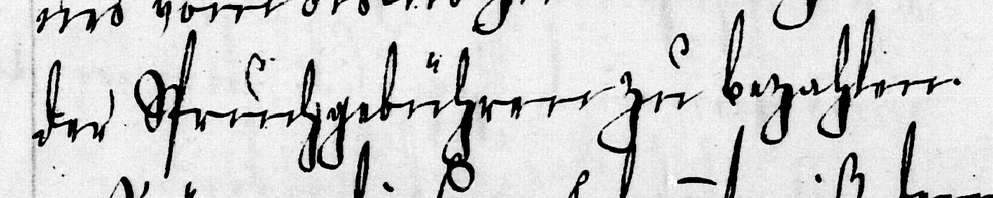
der Spruchgebühren zu bezahlen.
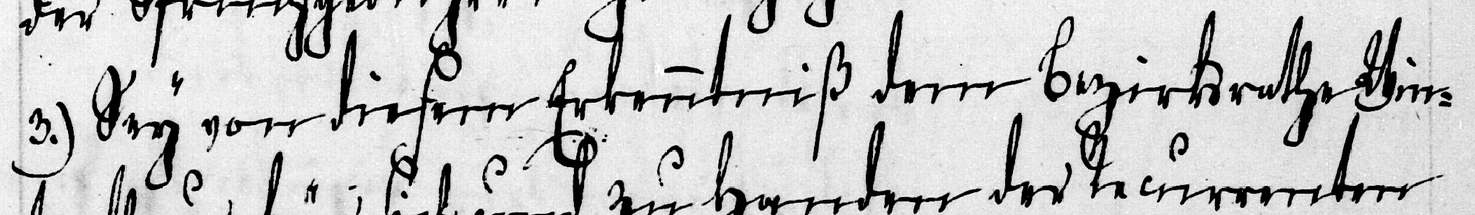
3.) Sey von diesem Erkenntniß dem Bezirksrathe Win¬
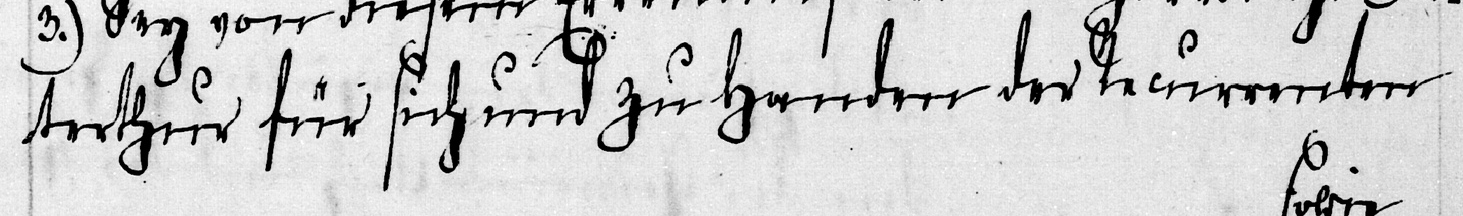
terthur für sich und zu Handen der Recurrenten
